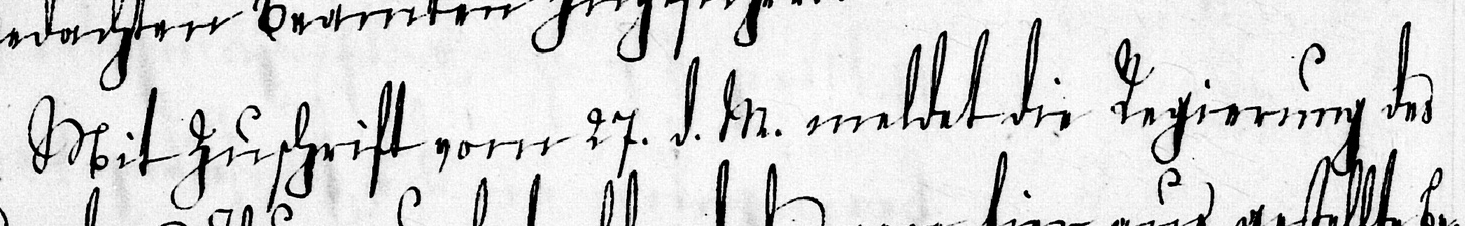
Mit Zuschrift vom 27. d. M. meldet die Regierung des
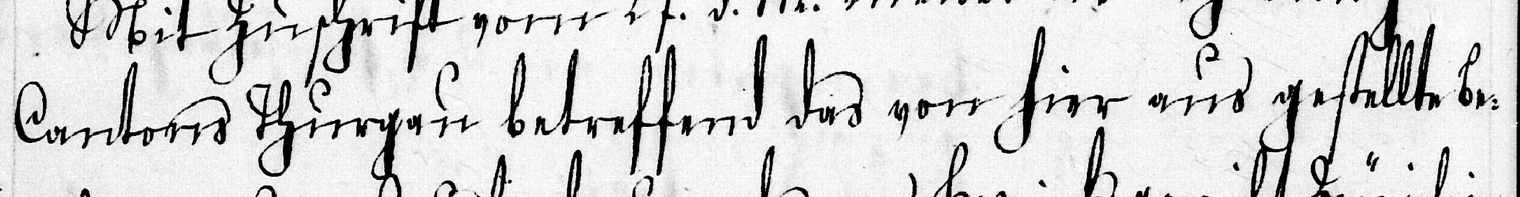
Cantons Thurgau betreffend das von hier aus gestellte
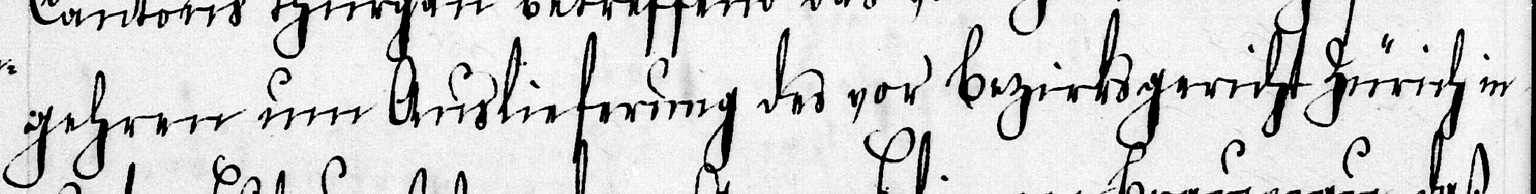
gehren um Auslieferung des vor Bezirksgericht Zürich in
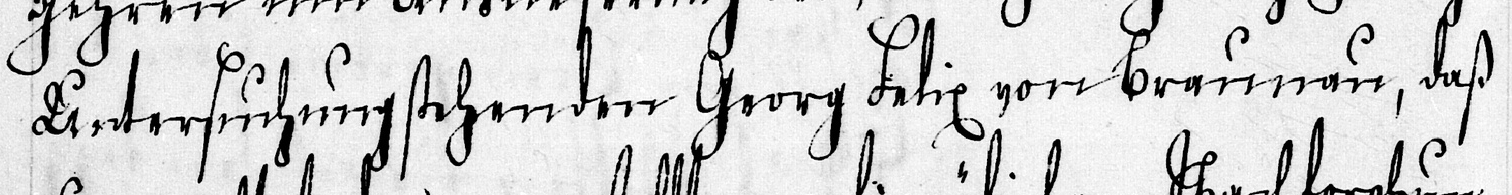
Untersuchung stehenden Georg Felix von Braunau, daß
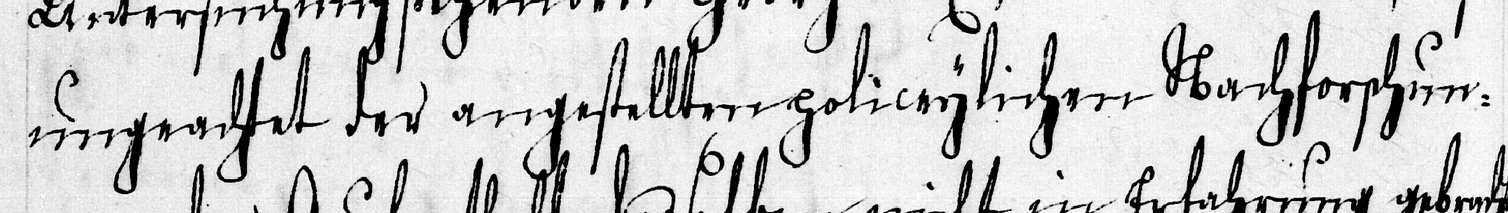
ungeachtet der angestellten policeylichen Nachforschun¬
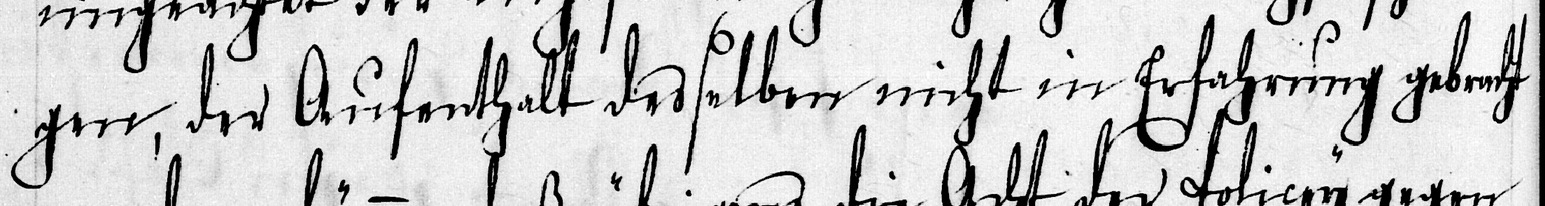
gen, der Aufenthalt desselben nicht in Erfahrung gebrac¬
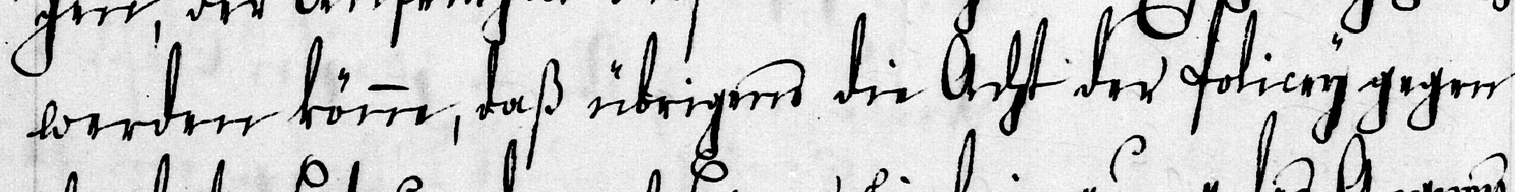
werden könne, daß übrigens die Acht der Policey gegen
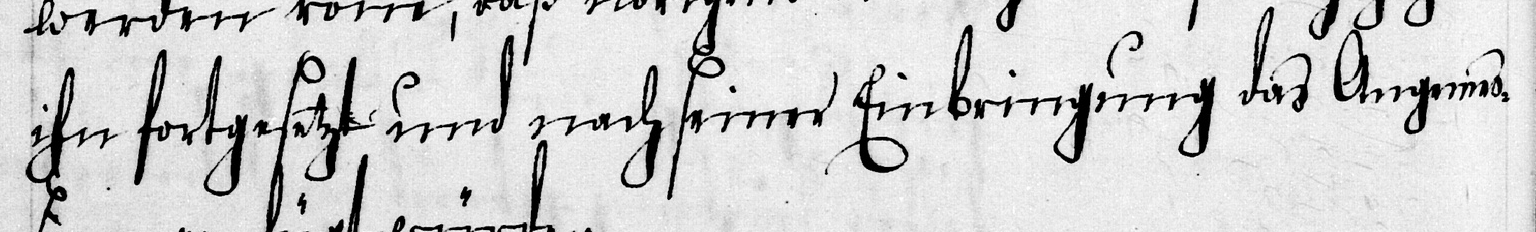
ihn fortgesetzt und nach seiner Einbringung das Angeme¬
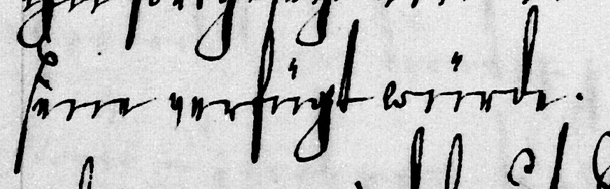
ßene verfügt würde.
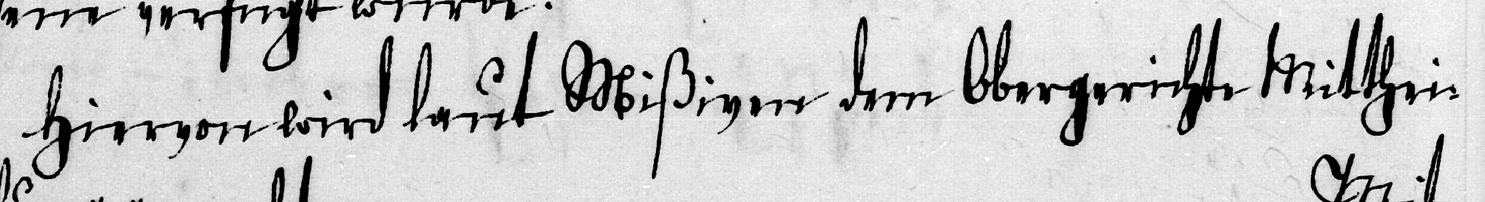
Hiervon wird laut Mißiven dem Obergerichte Mitthei¬
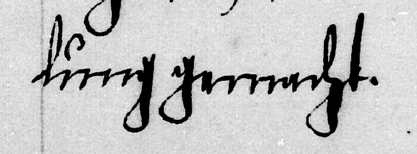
lung gemacht.
